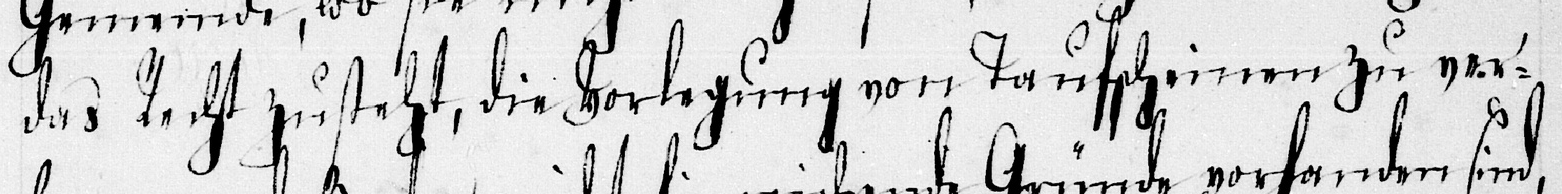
das Recht zusteht, die Vorlegung von Taufscheinen zu ver¬
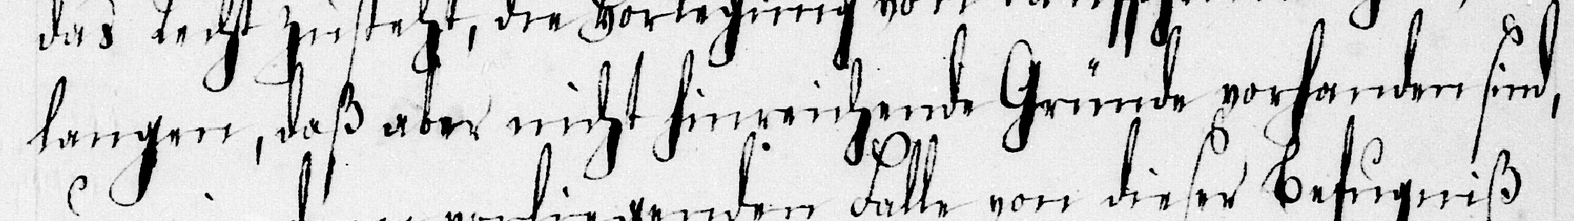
langen, daß aber nicht hinreichende Gründe vorhanden sind,
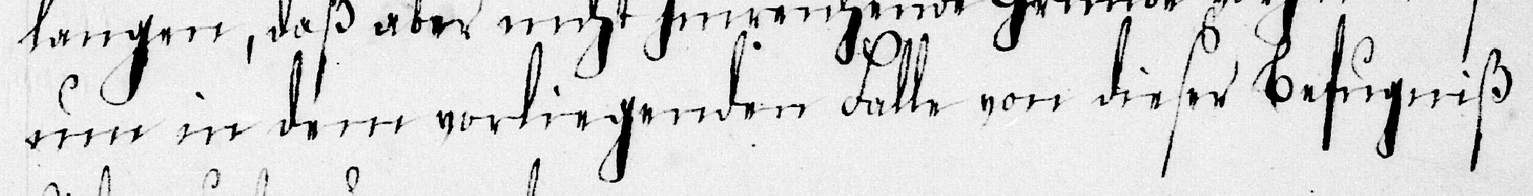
um in dem vorliegenden Falle von dieser Befugniß
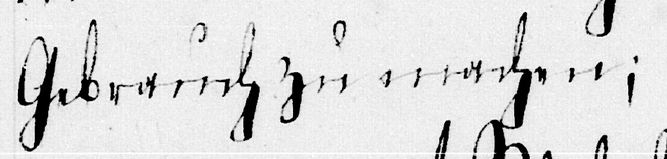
Gebrauch zu machen;
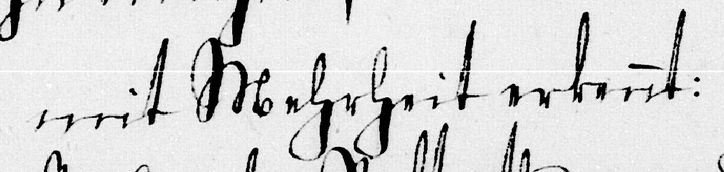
mit Mehrheit erkannt:
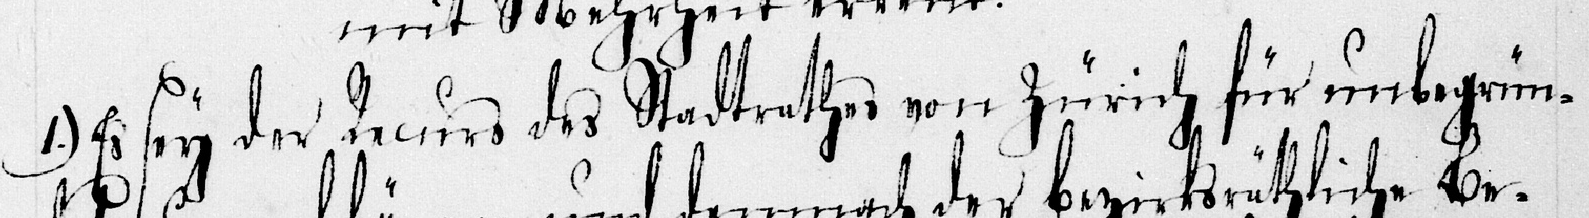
Es sey der Recurs des Stadtrathes von Zürich für unbegrün¬
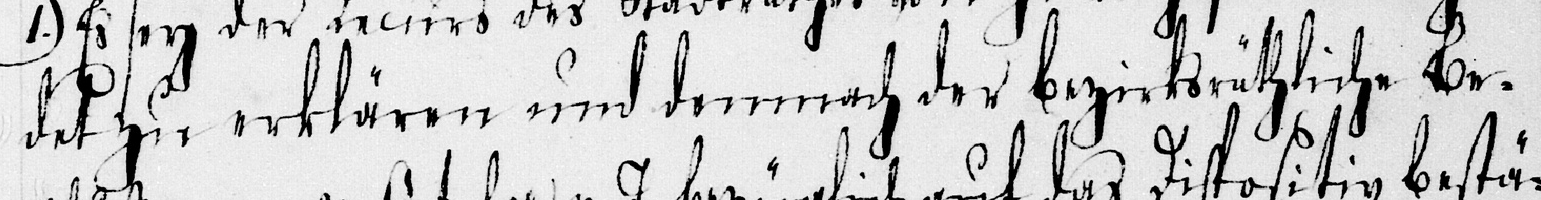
det zu erklären und demnach der bezirksräthliche Be¬
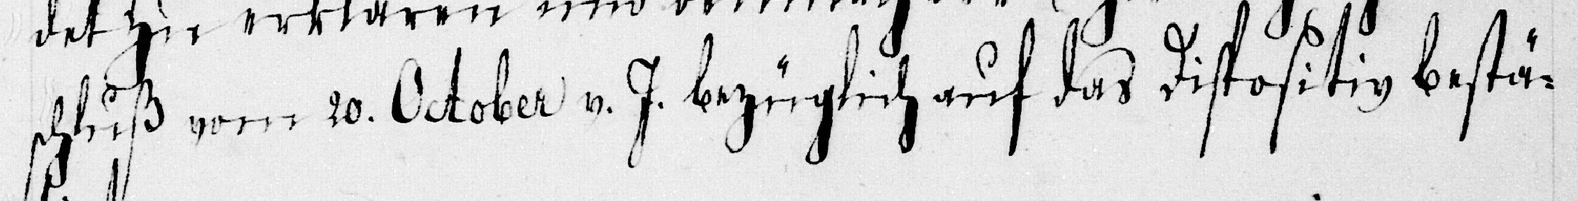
schluß vom 20. October v. J. bezüglich auf das Dispositiv bestä¬
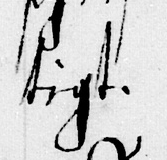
tigt.
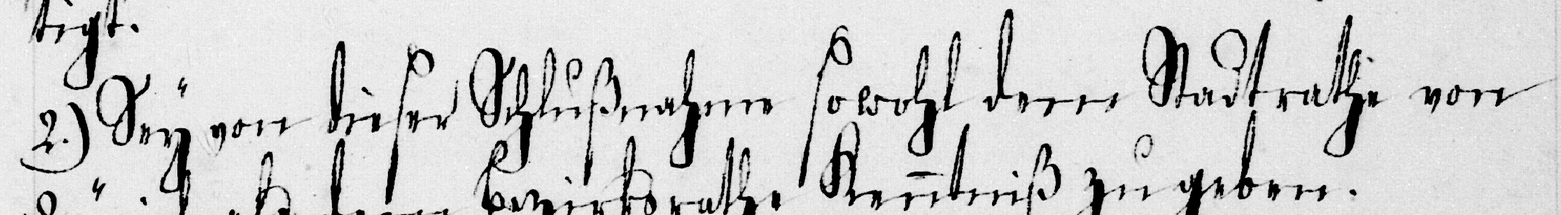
2.) Sey von dieser Schlußnahme sowohl dem Stadtrathe von
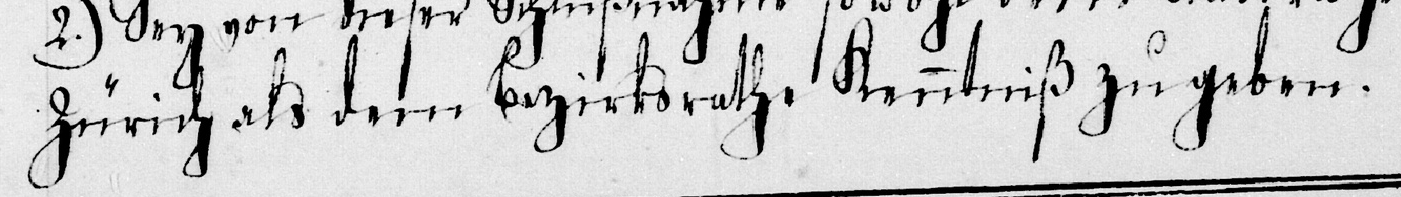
Zürich als dem Bezirksrathe Kenntniß zu geben.
